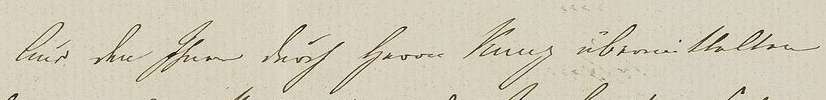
Aus den Ihnen durch Herrn Kunz übermittelten
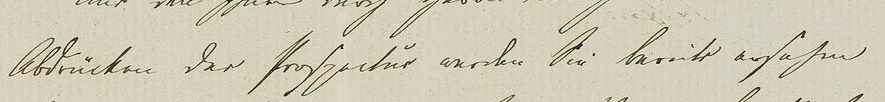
Abdrücken des Prospectus werden sie bereits ersehen
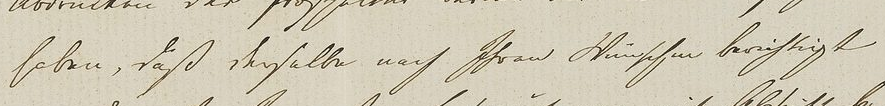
haben, daß derselbe nach Ihren Wünschen berichtigt
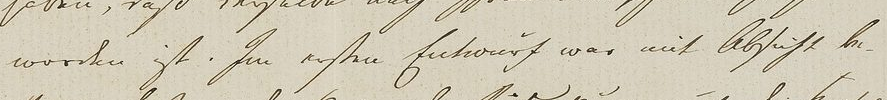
worden ist. Im ersten Entwurf war mit Absicht be-
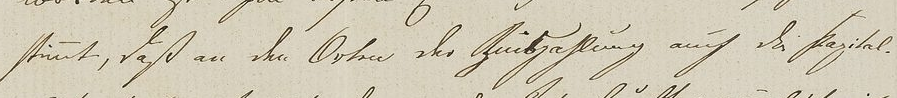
stimmt, daß an den Orten der Zinszahlung auch die Kapital-
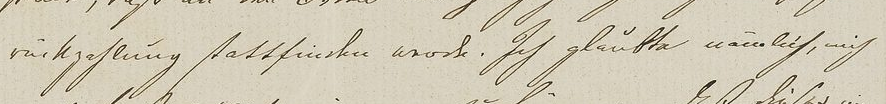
rückzahlung stattfinden werde. Ich glaubte nämlich, mich
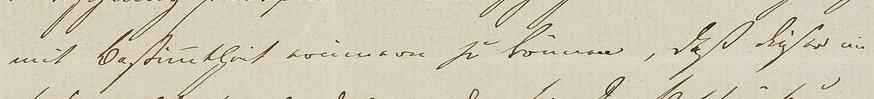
mit Bestimmtheit erinnern zu können, daß dieses im
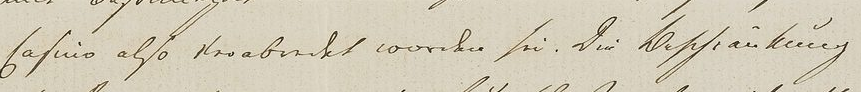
Casino also verabredet worden sei. Die Beschränkung
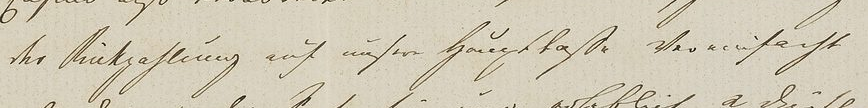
der Rückzahlung auf unsere Hauptkasse vereinfacht
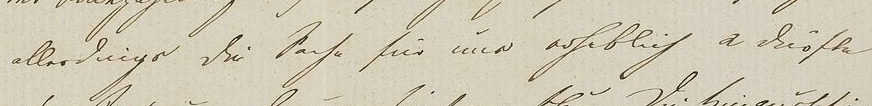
allerdings die Sache für uns erheblich & dürfte
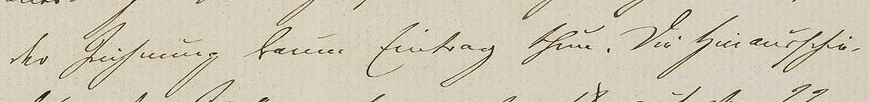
der Zeichnung kaum Eintrag thun. Die Hinausschie-
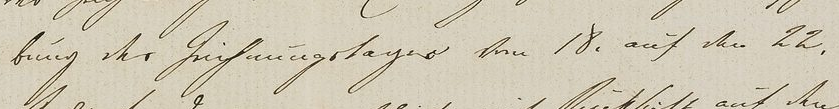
bung des Zeichnungstages von 18. auf den 22.
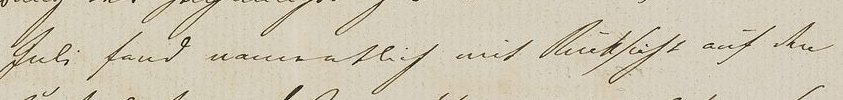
Juli fand namentlich mit Rücksicht auf den
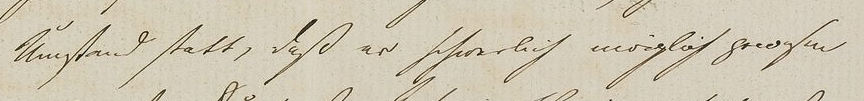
Umstand statt, daß es schwerlich möglich gewesen
